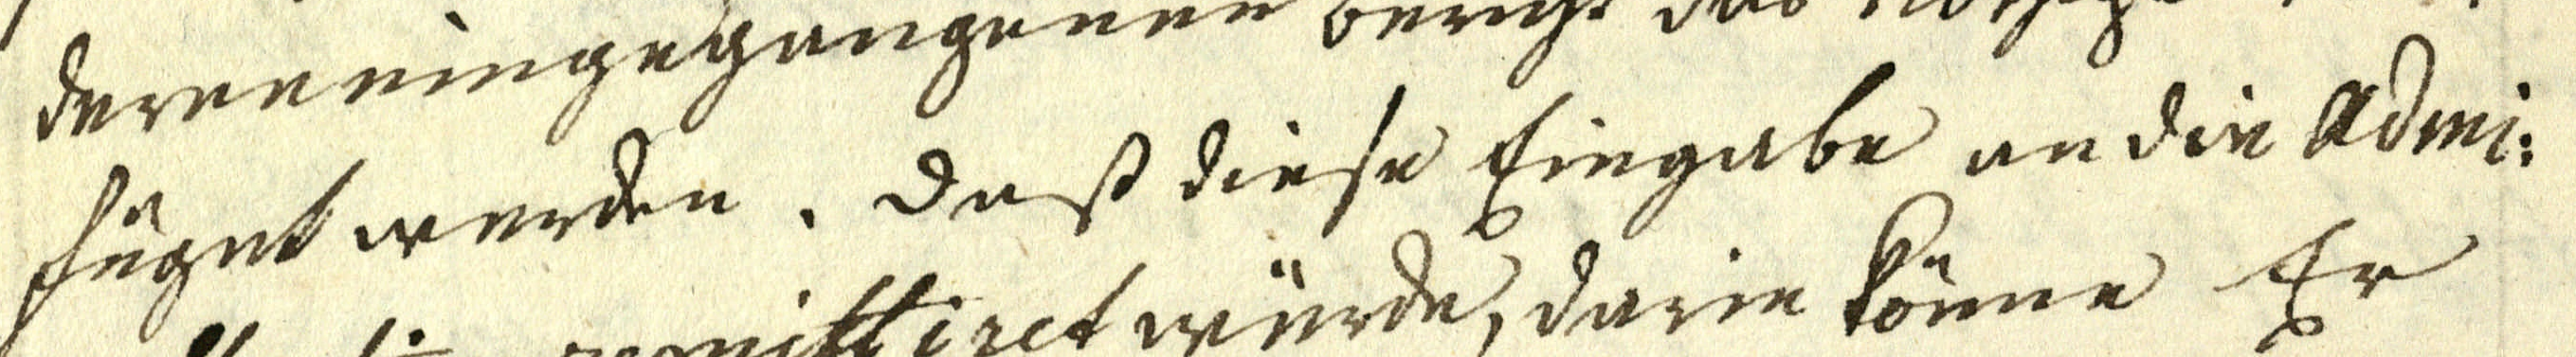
füget werden. Daß diese Eingabe an die Admi¬
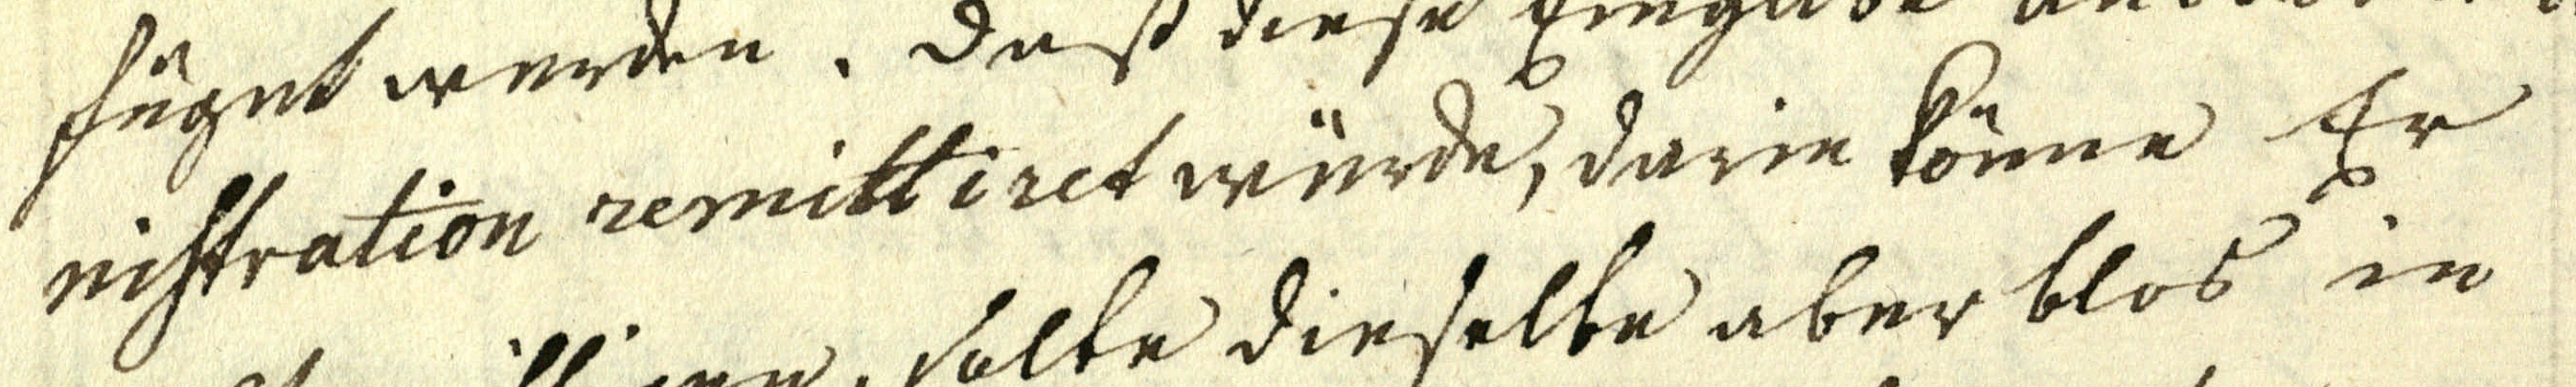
nistration remittiret würde, darin könne Er
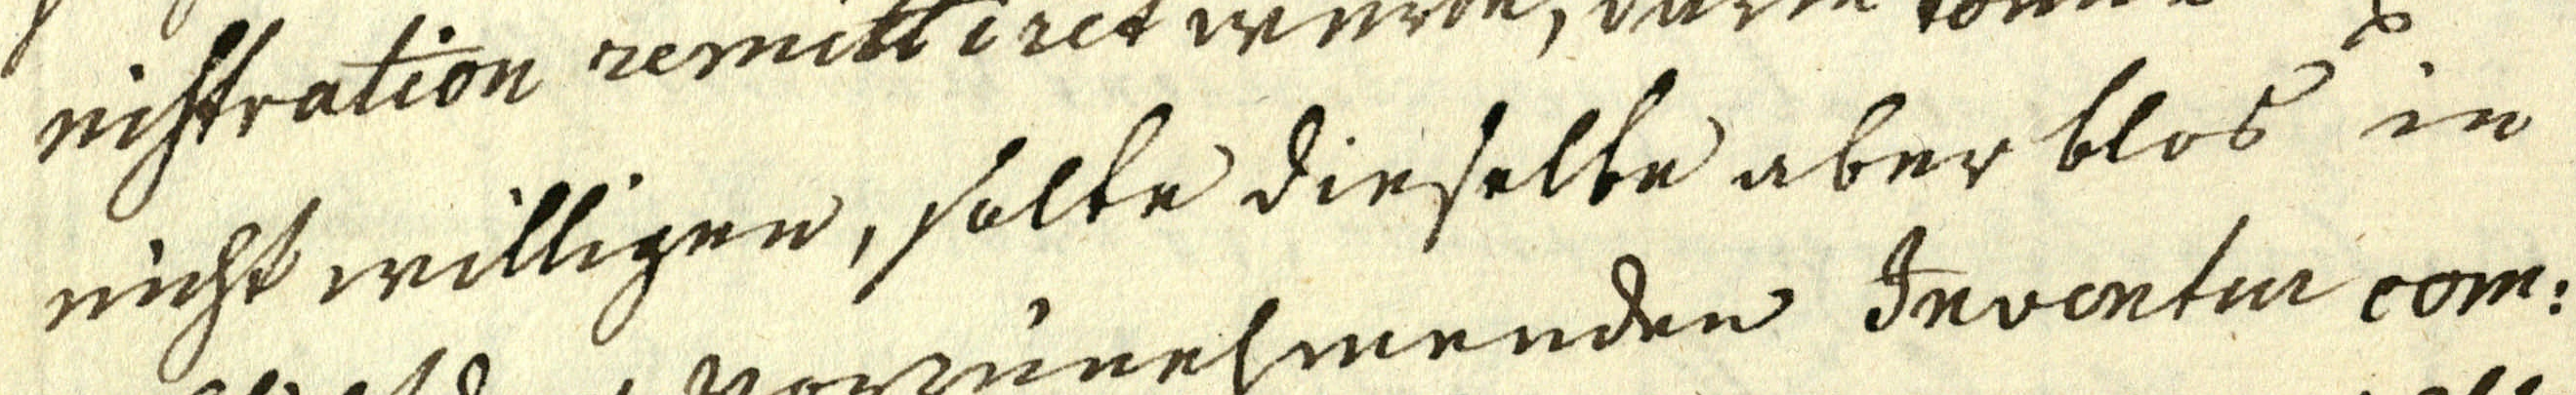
nicht willigen, solte dieselbe aber blos in
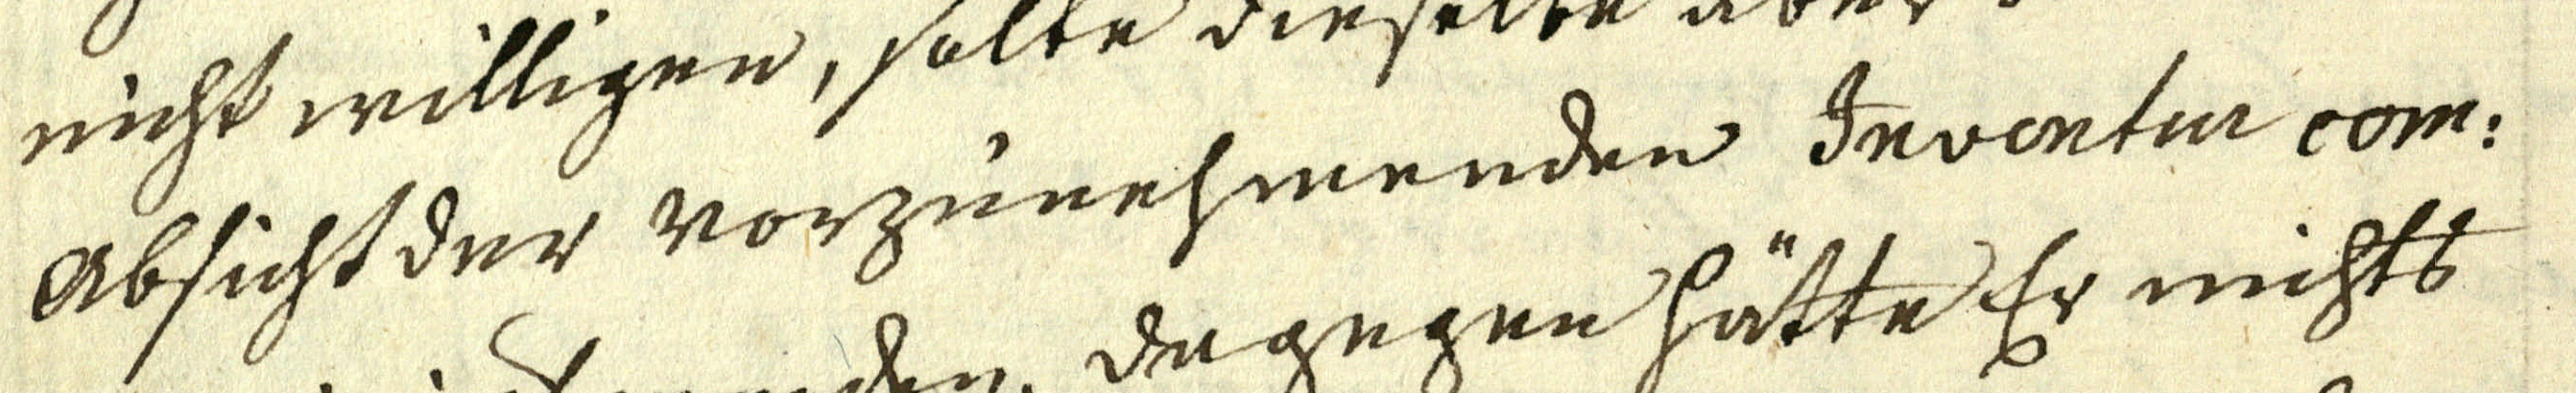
Absicht der vorzunehmenden Inventur com¬
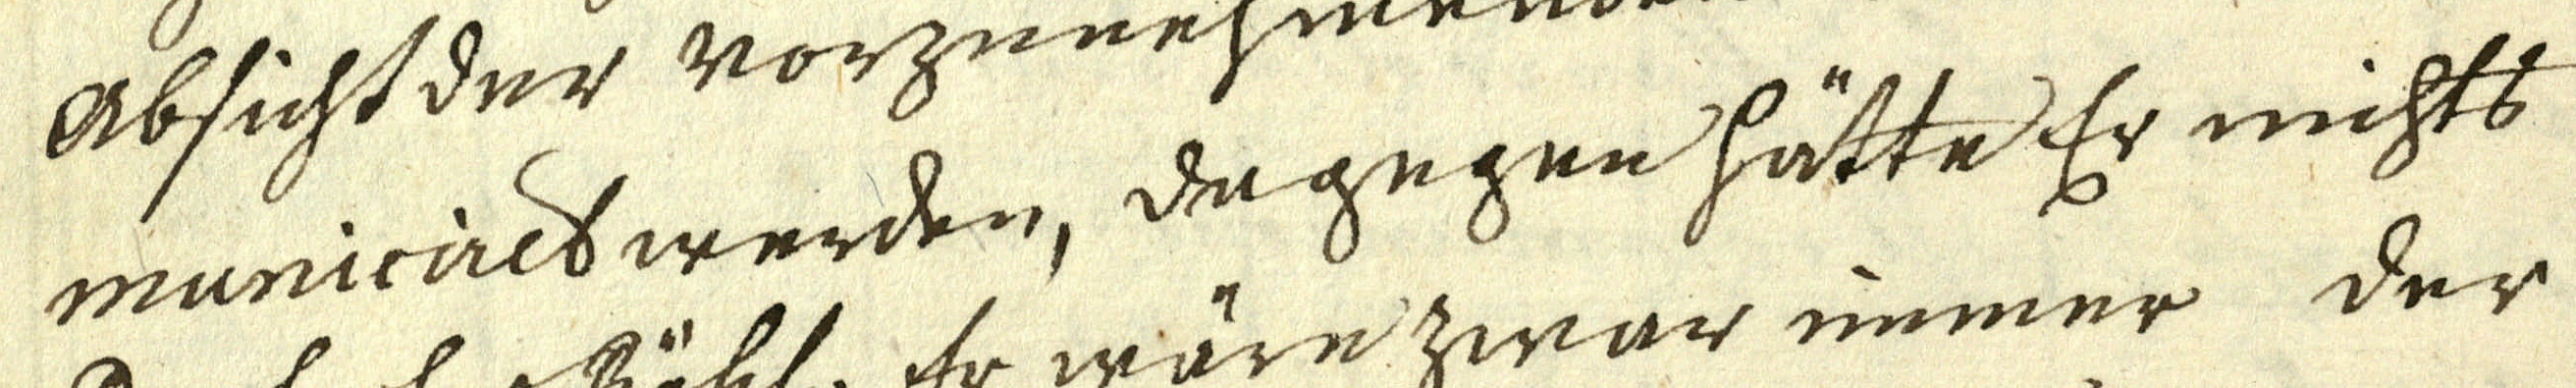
municiret werden, dagegen hätte Er nichts
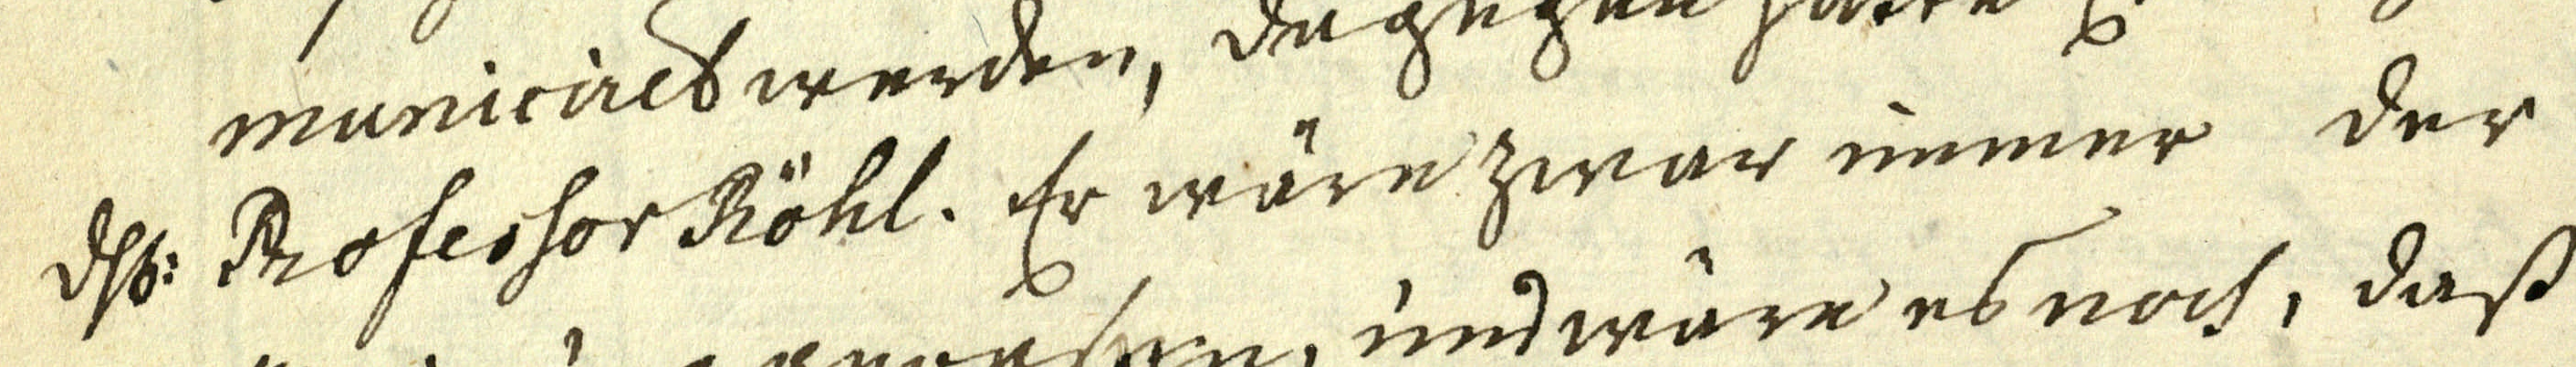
dh Professor Röhl. Er wäre zwar immer der
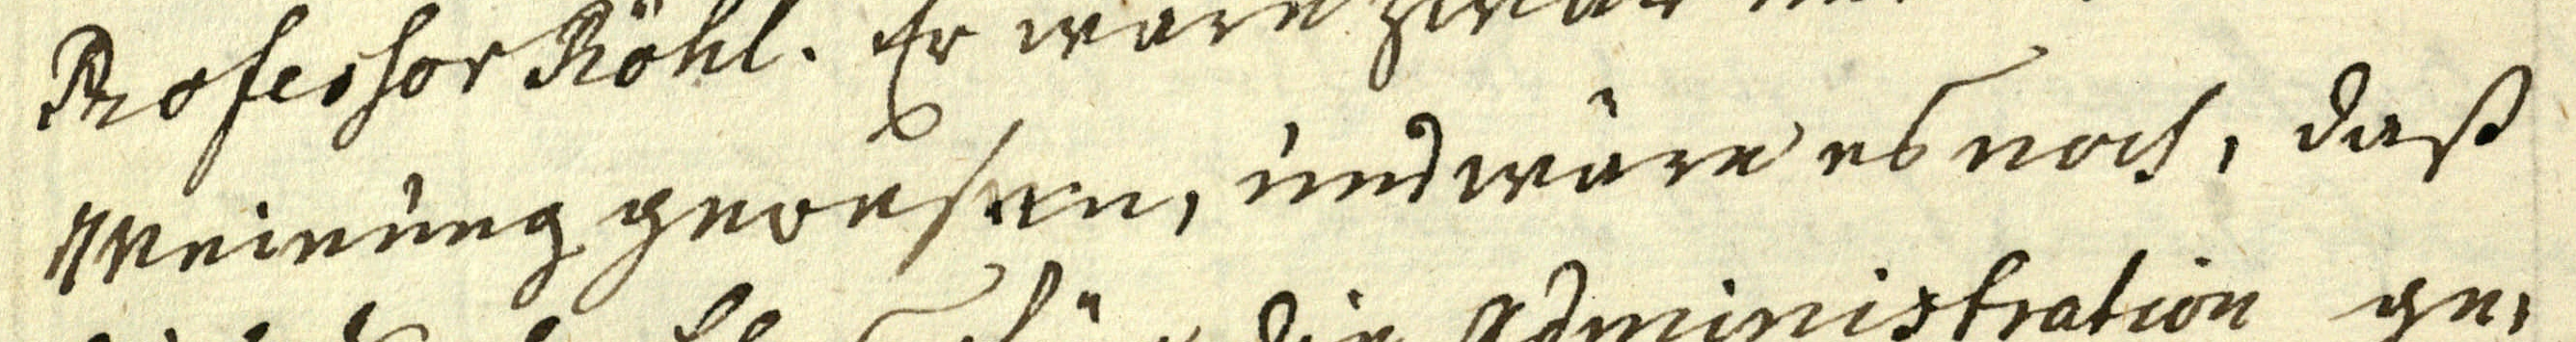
Meinung gewesen, und wäre es noch, daß
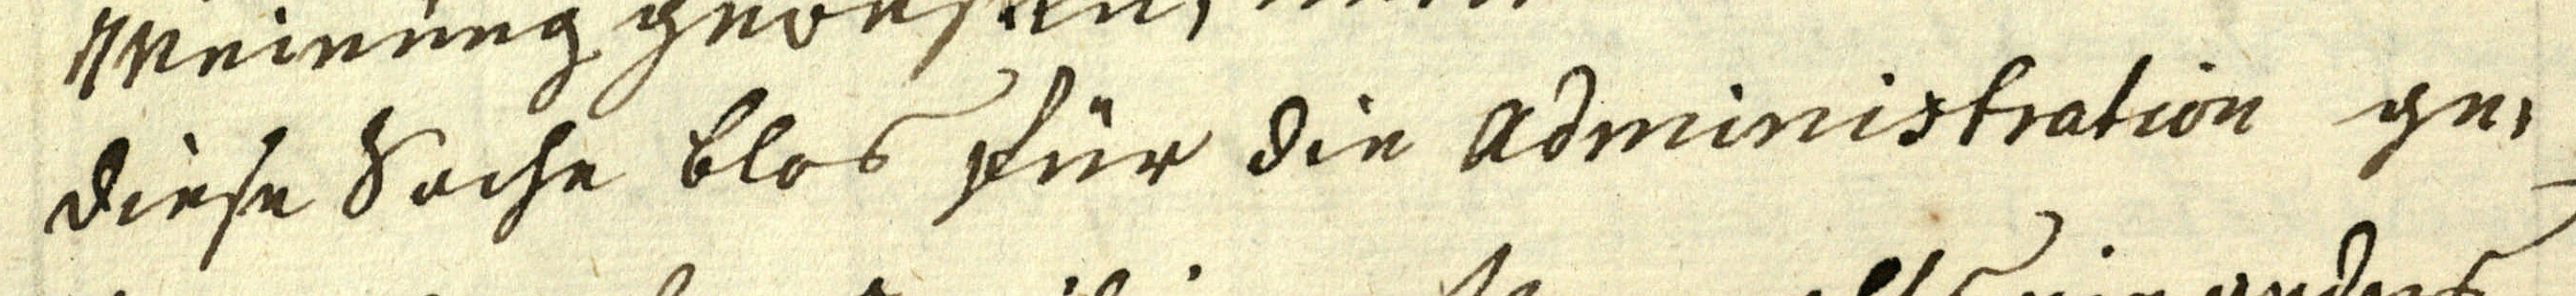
diese Sache blos für die Administration ge¬
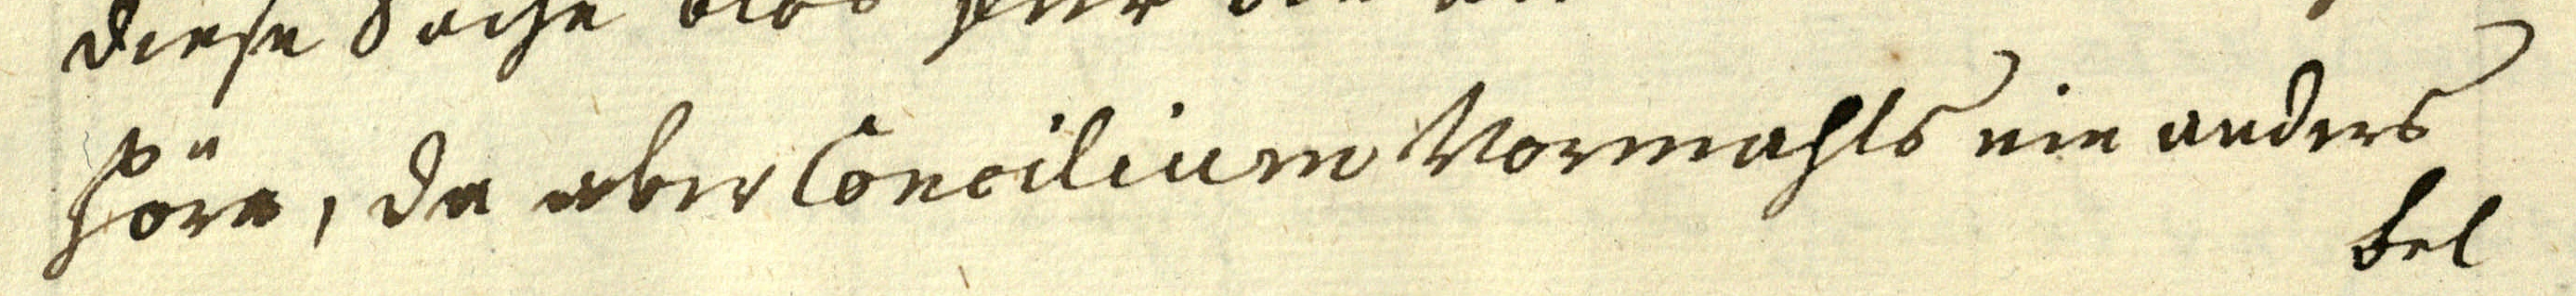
höre, da aber Concilium vormahls ein andres
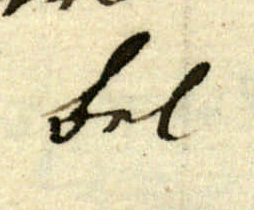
Bel
